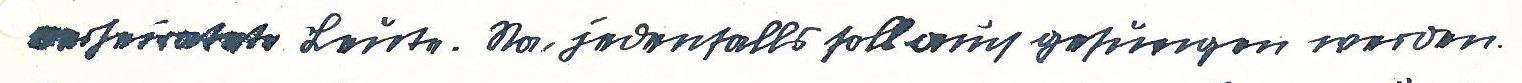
verheiratete Leute. Na, jedenfalls soll auch gesungen werden.
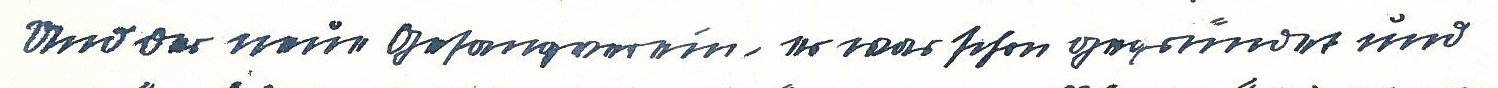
Und der neue Gesangverein, er war schon gegründet und
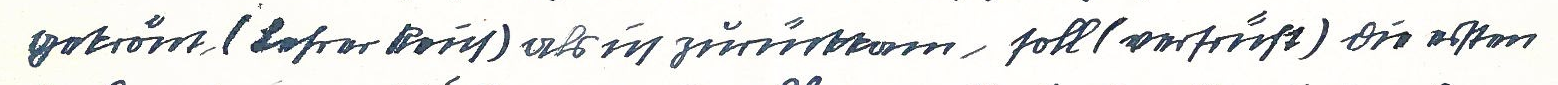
gekrönt, (Lehrer R.) als ich zurückkam, soll (verfrüht) die ersten
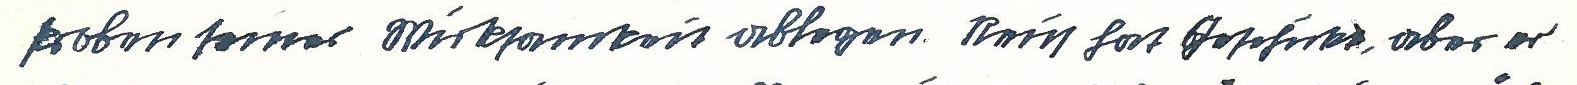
Proben seiner Wirksamkeit ablegen. R. hat Geschick, aber er
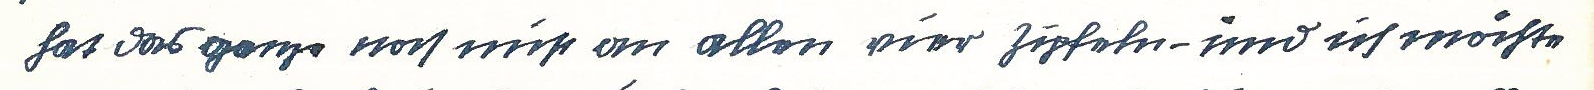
hat das ganze noch nicht an allen vier Zipfeln – und ich möchte
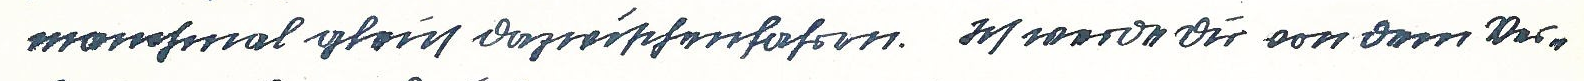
manchmal gleich dazwischenfahren. Ich werde Dir von dem Ver¬
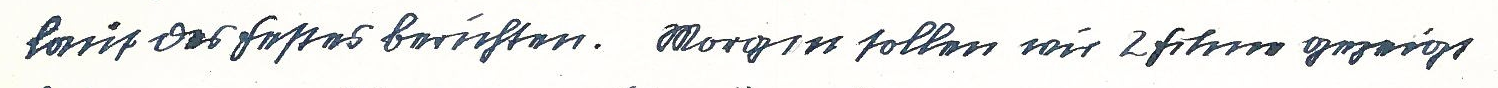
lauf des Festes berichten. Morgen sollen wir 2 Filme gezeigt
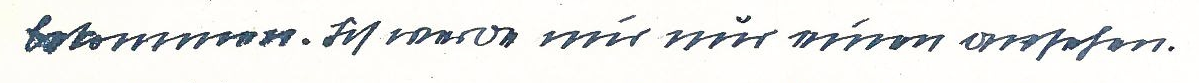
bekommen. Ich werde mir nur einen ansehen.
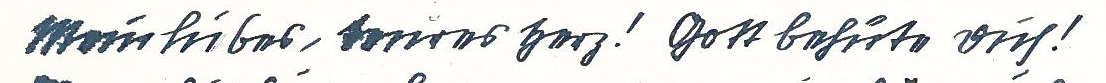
Mein liebes, teures Herz! Gott behüte Dich!
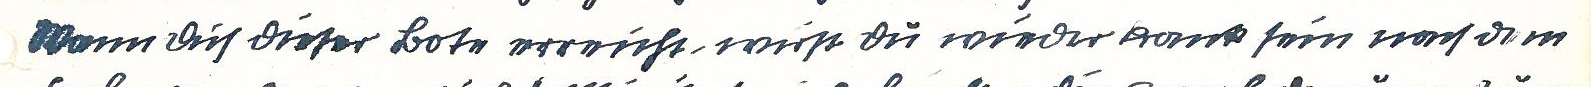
Wenn Dich dieser Bote erreicht, wirst Du wieder krank sein nach dem
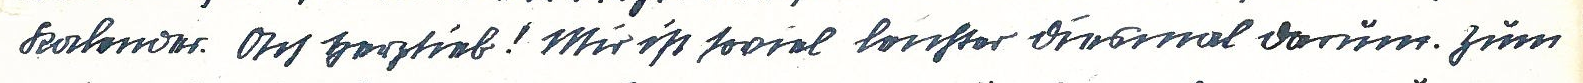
Kalender. Ach Herzlieb! Mir ist so viel leichter diesmal darum. Zum
